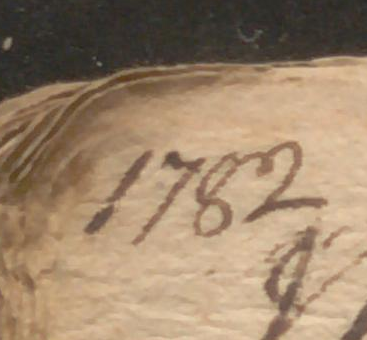1782
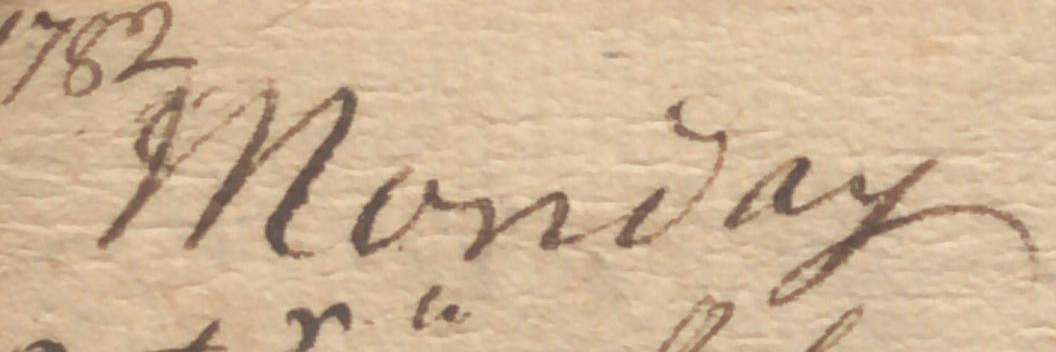Monday
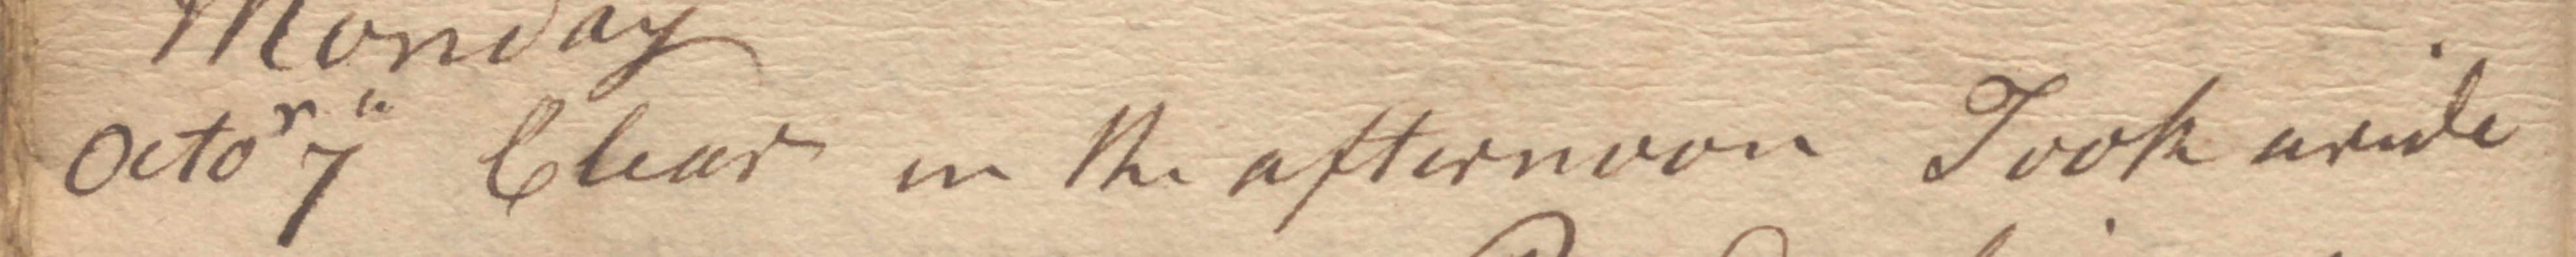Octo^r 7^th Clear in the afternoon Took a ride
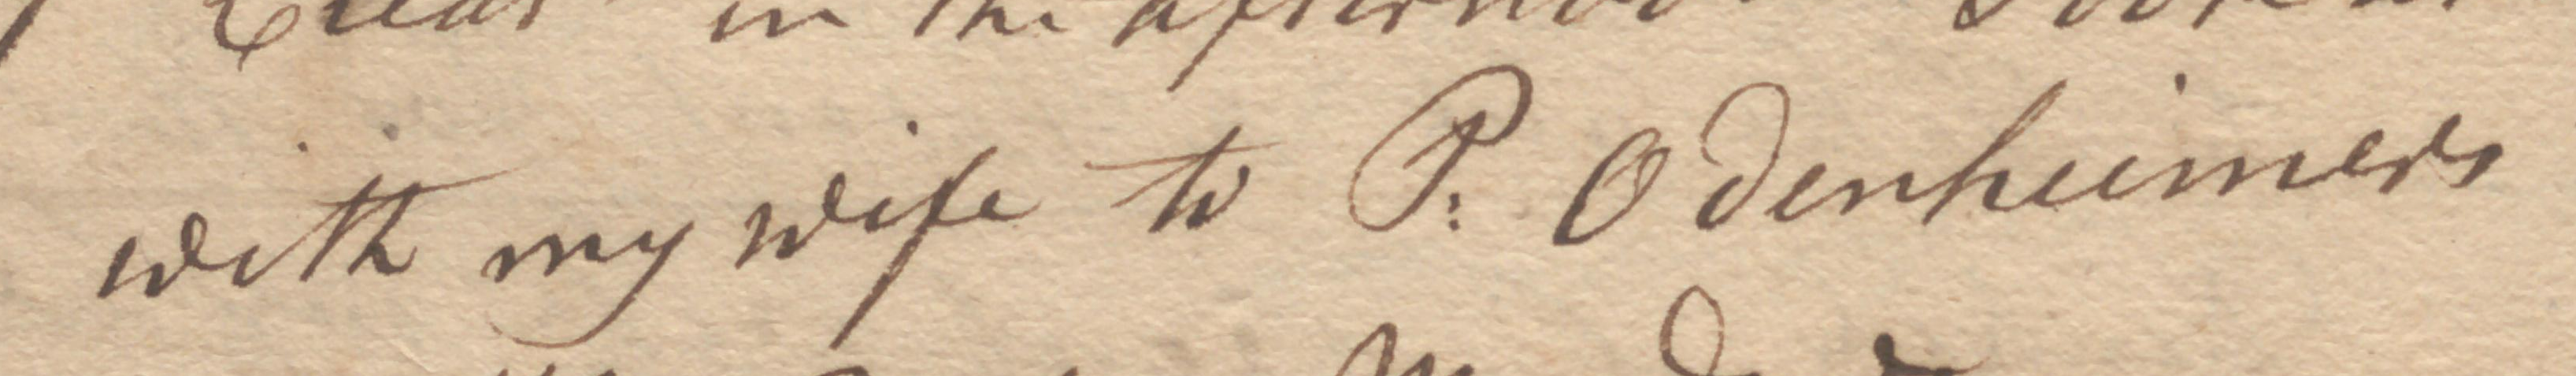with my wife to P. Odenheimers
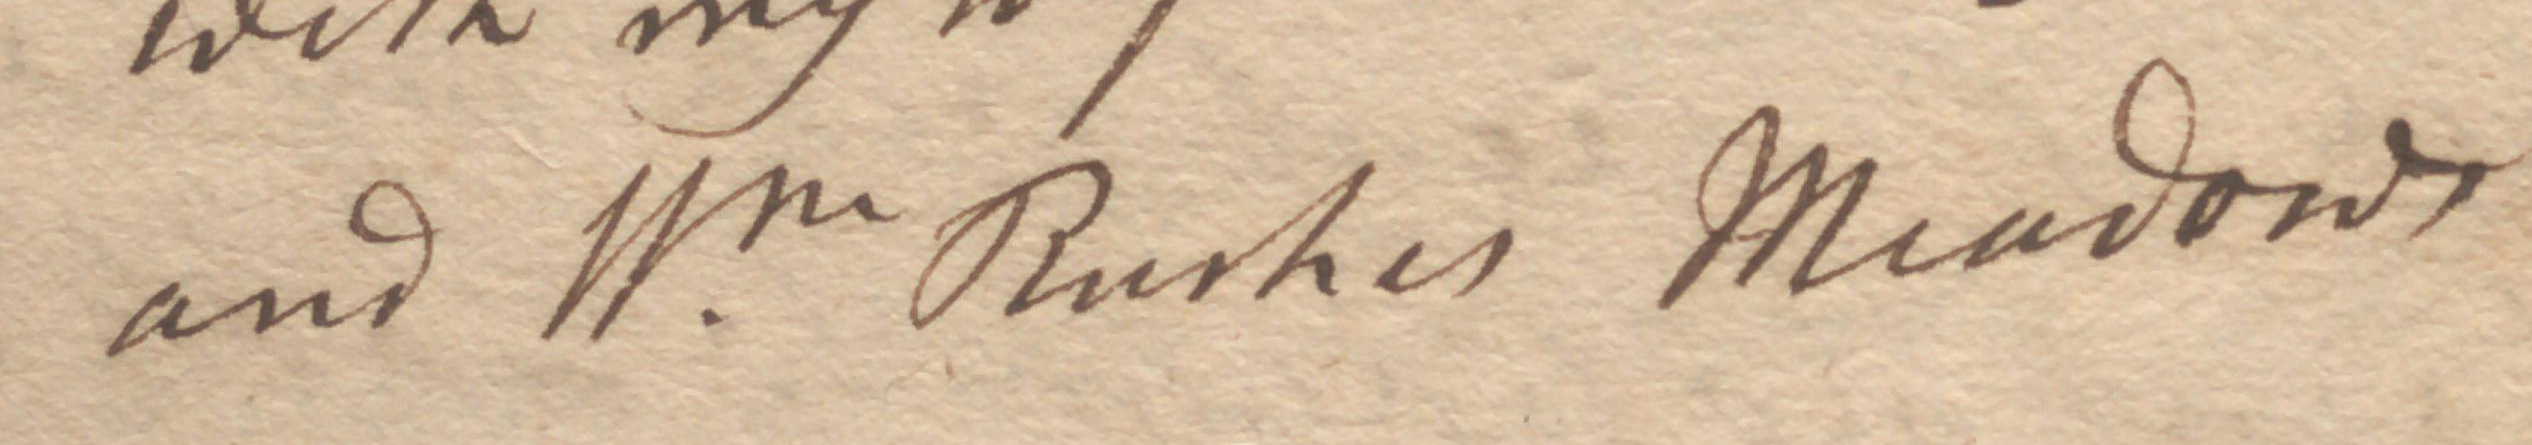and W^m. Rushes Meadows
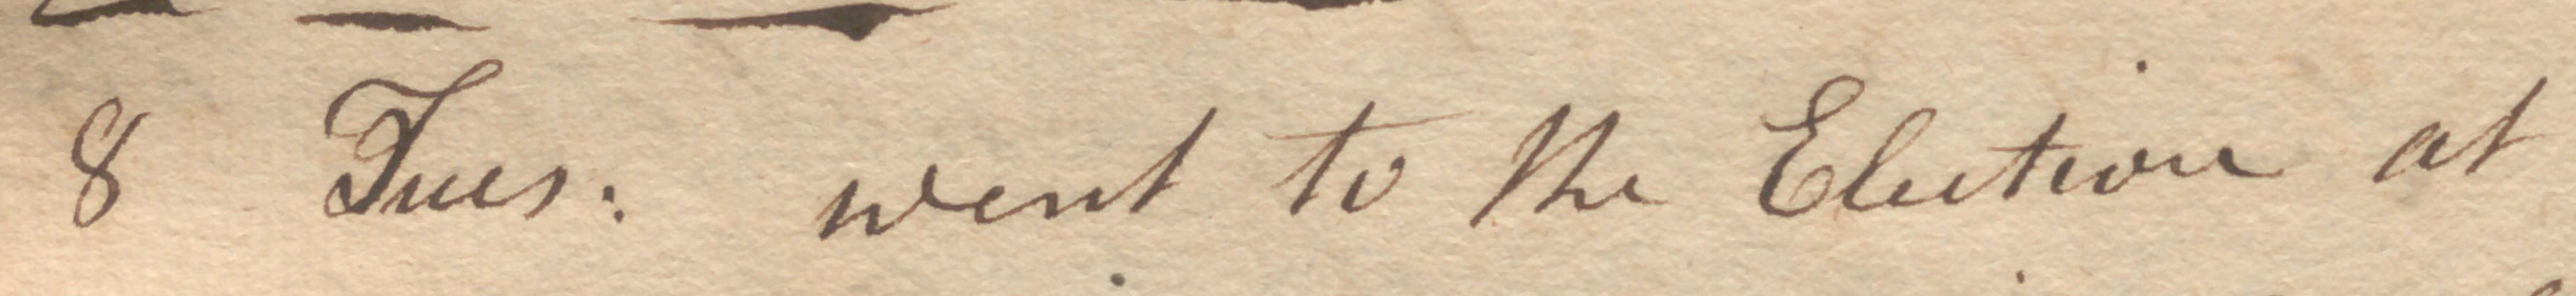8 Tues. went to the Election at
